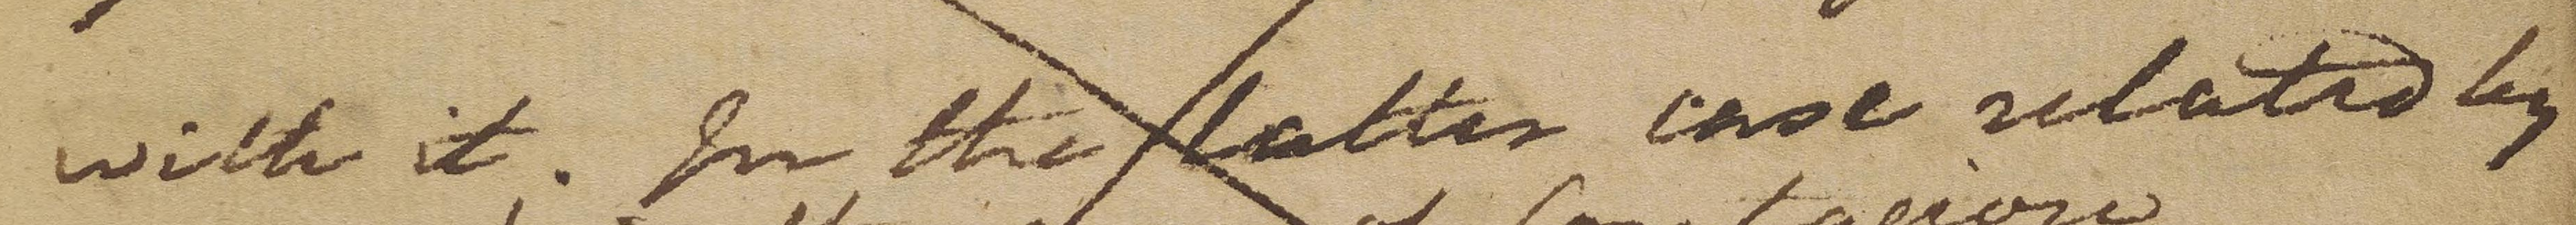with it. In the latter case related by
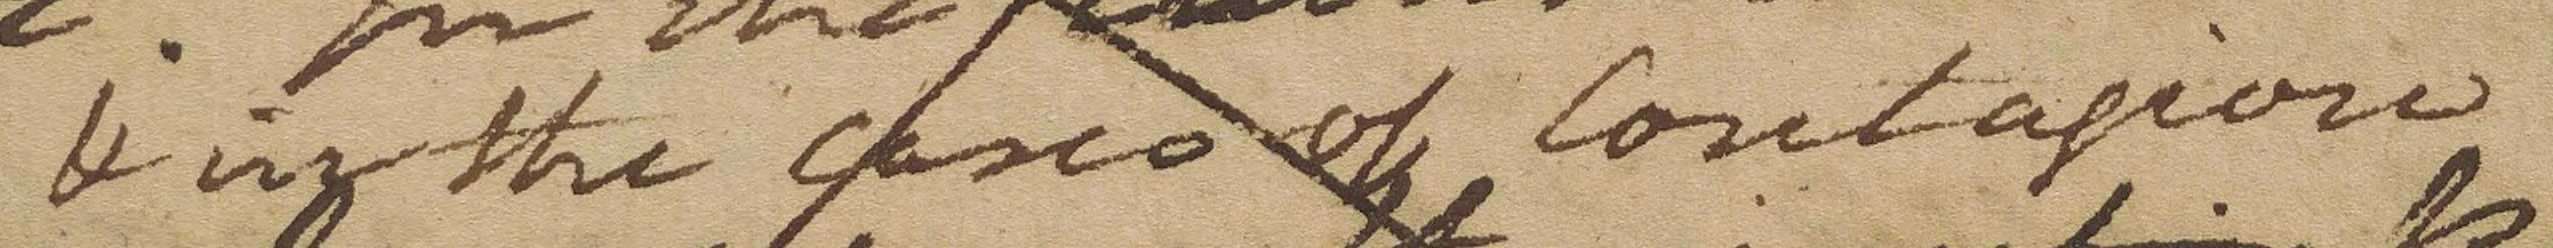& in the cases of Contagion
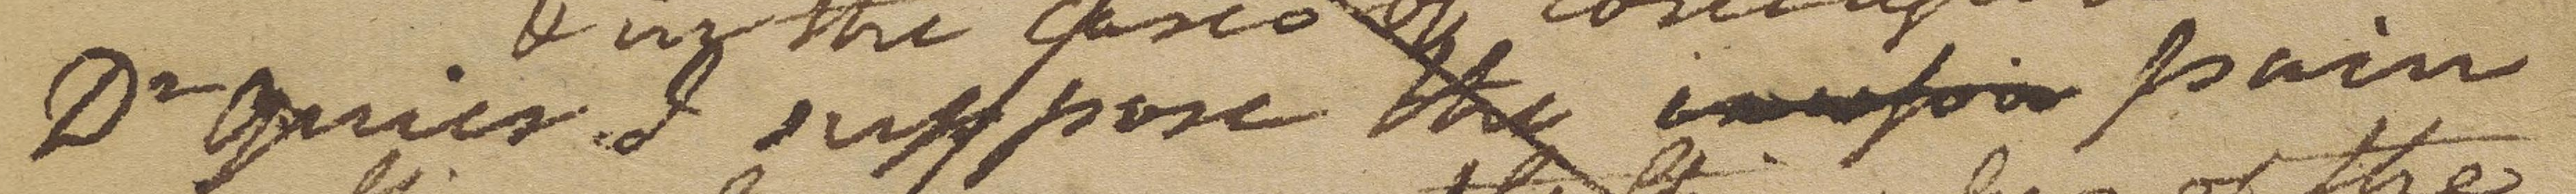D^r Grier I suppose the [infirm-] pain
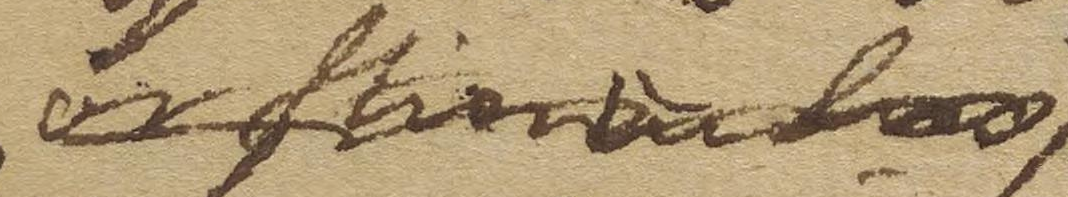[or of particulars]
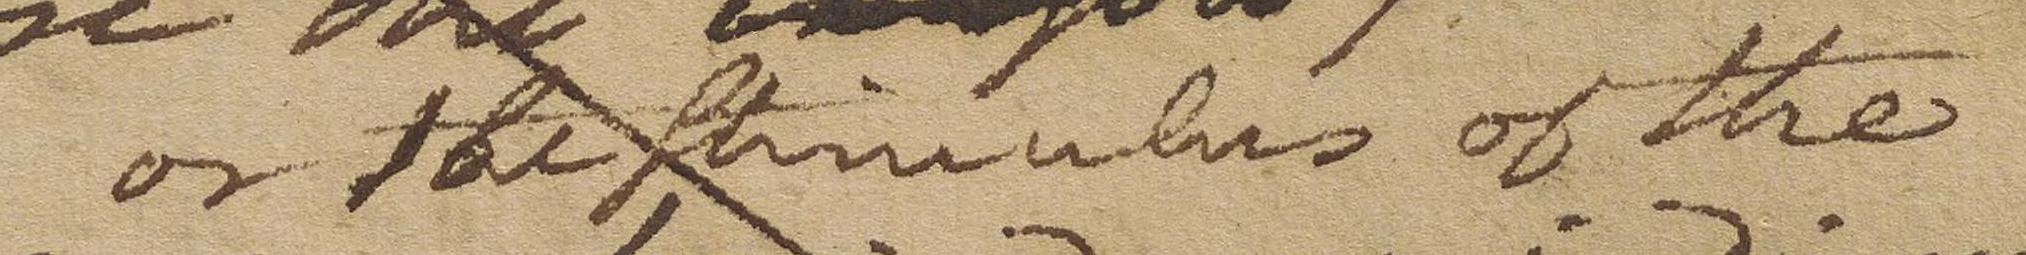or the Stimulus of the
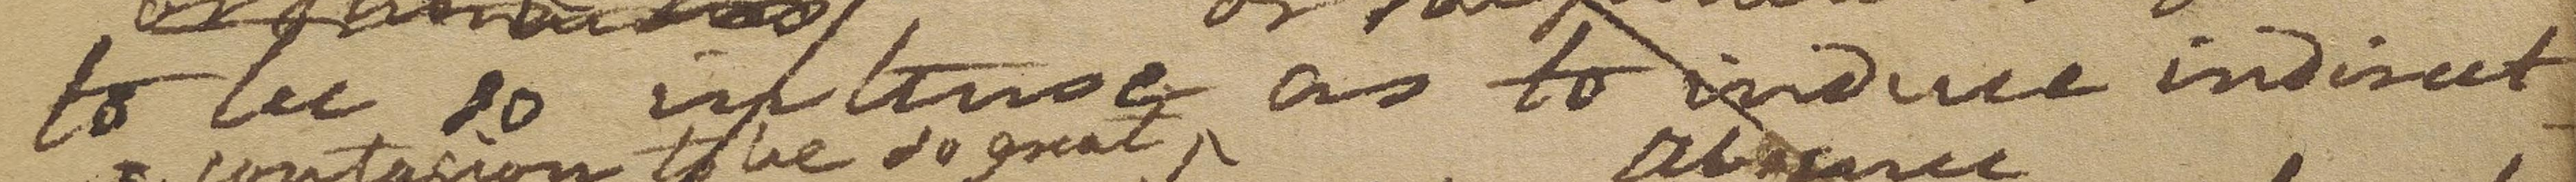to be so intense ^ as to induce indirect
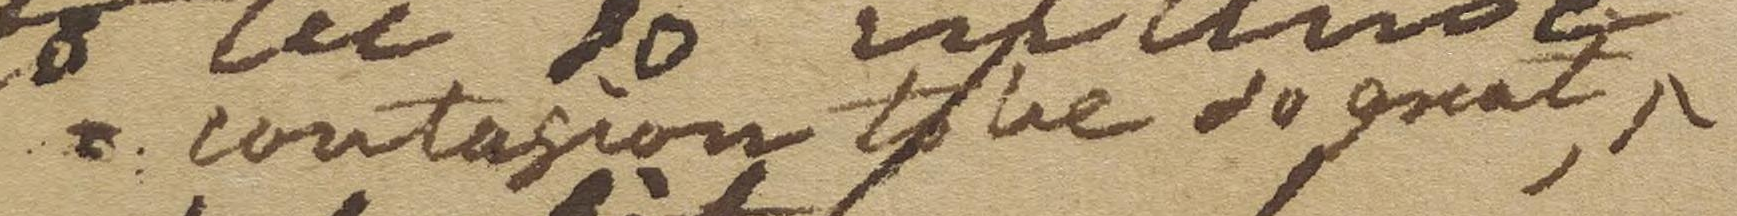contagion to be so great
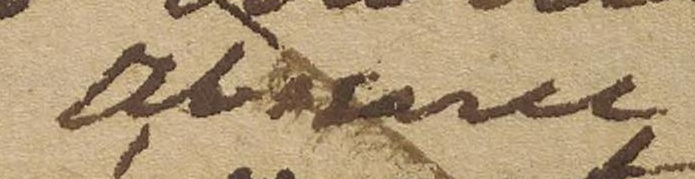absence
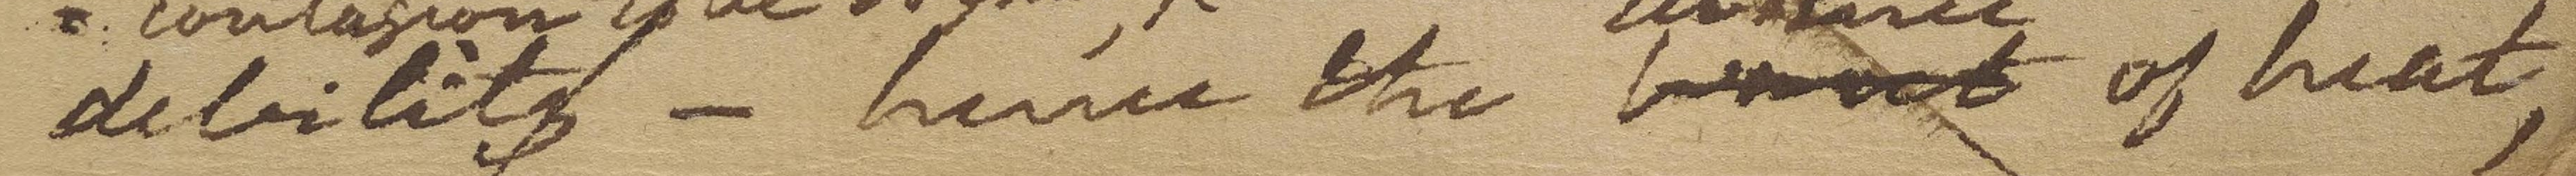debility - hence the [want] of heat,
